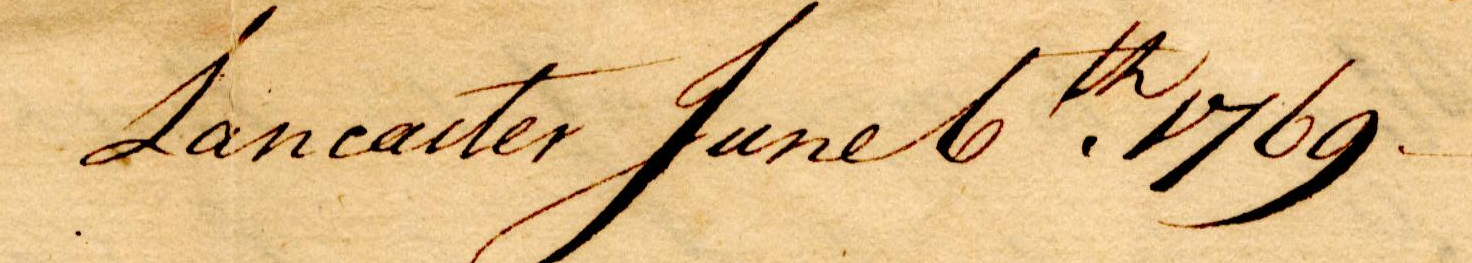Lancaster June 6^th 1769
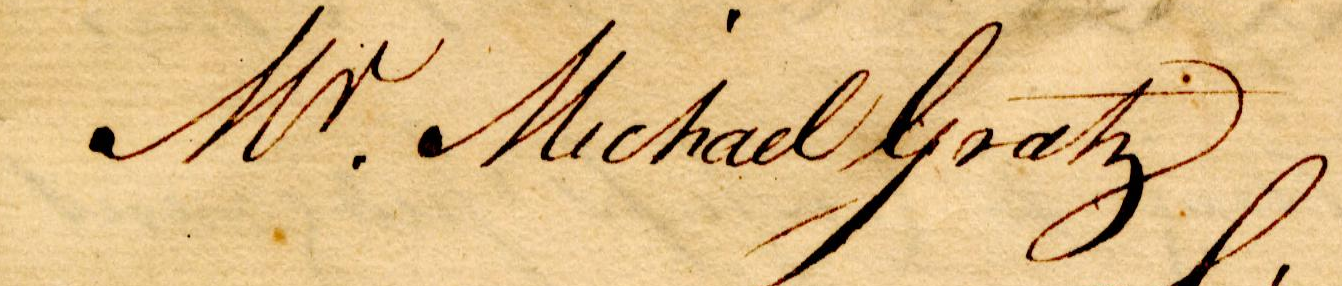M^r. Michael Gratz
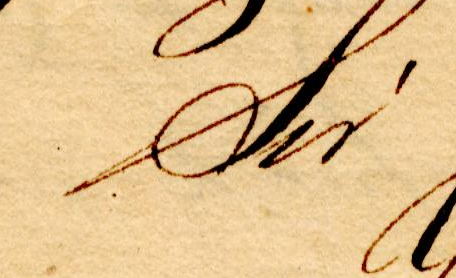Sir
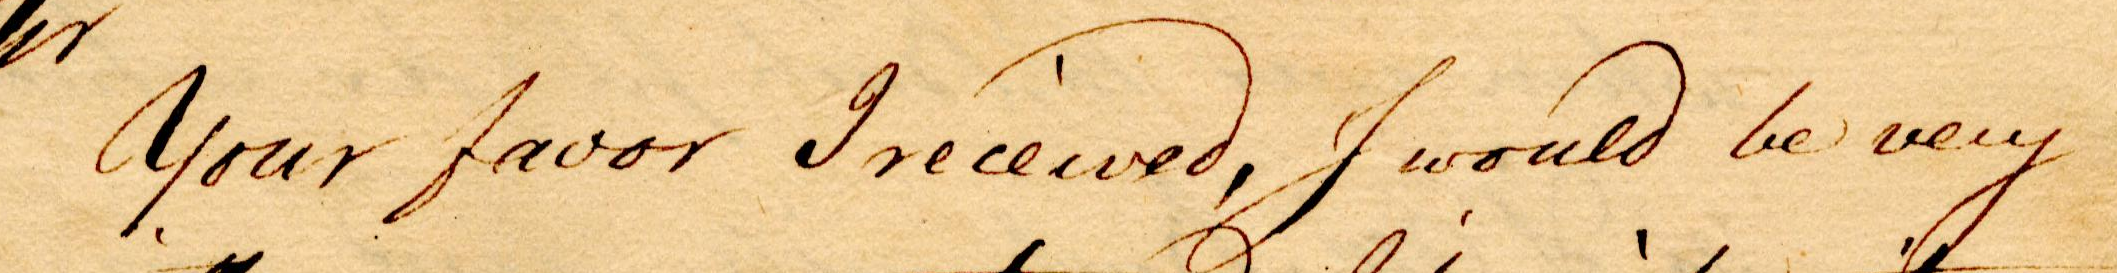Your favor I received, I would be very
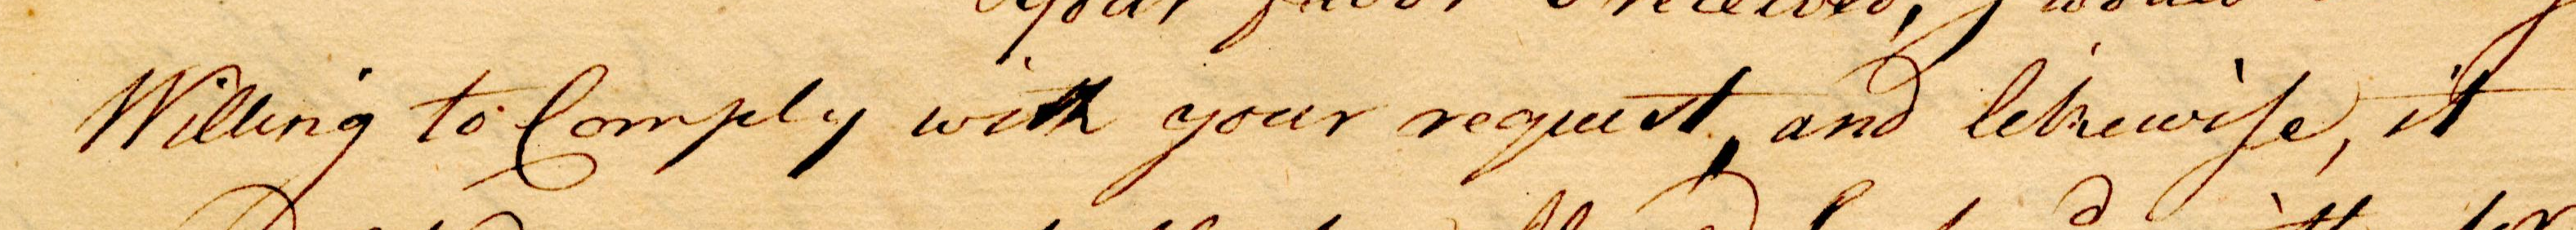Willing to Comply with your request, and likewise, it
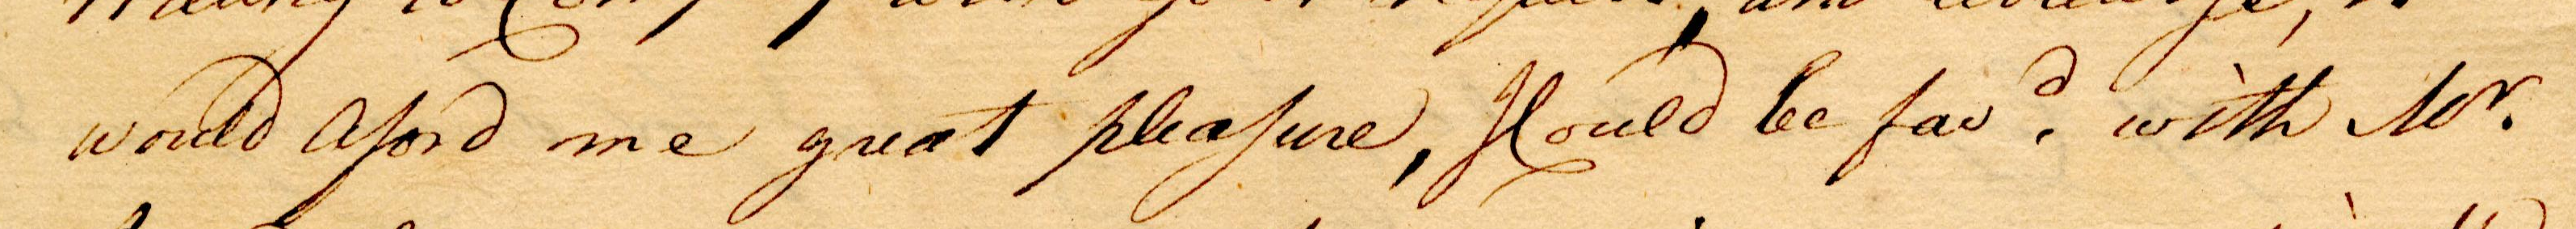would aford me great pleasure, I could be fav^d. with M^r
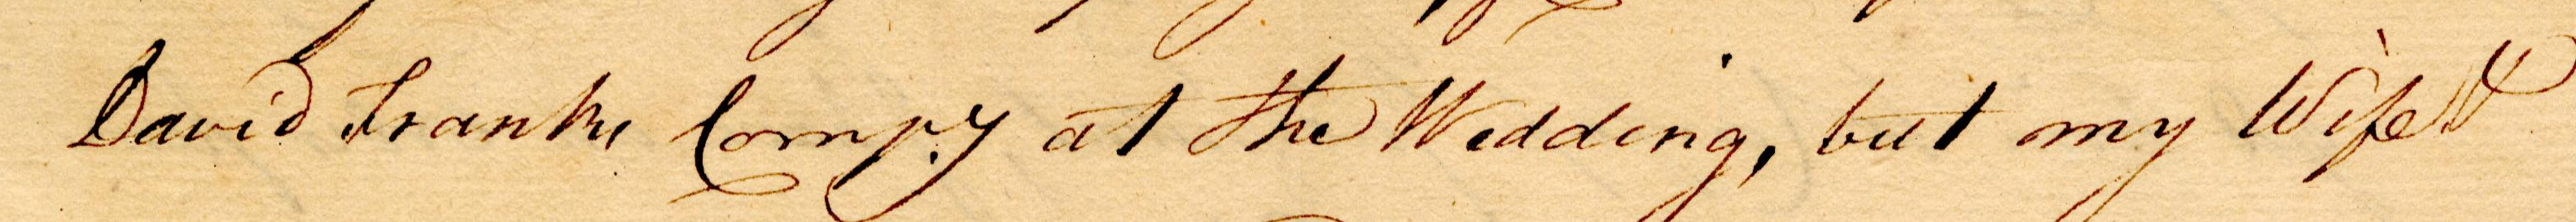David Franks Comp^y. at the Wedding, but my Wife &
